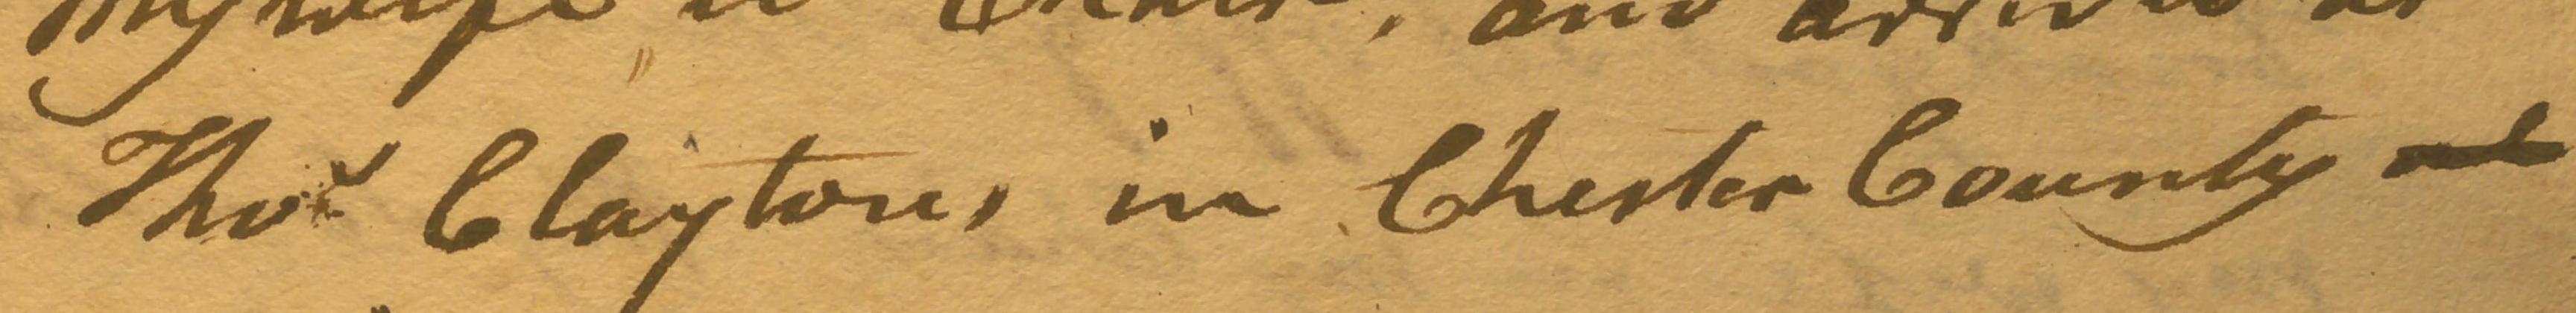Tho^s Claytons in Chester County o
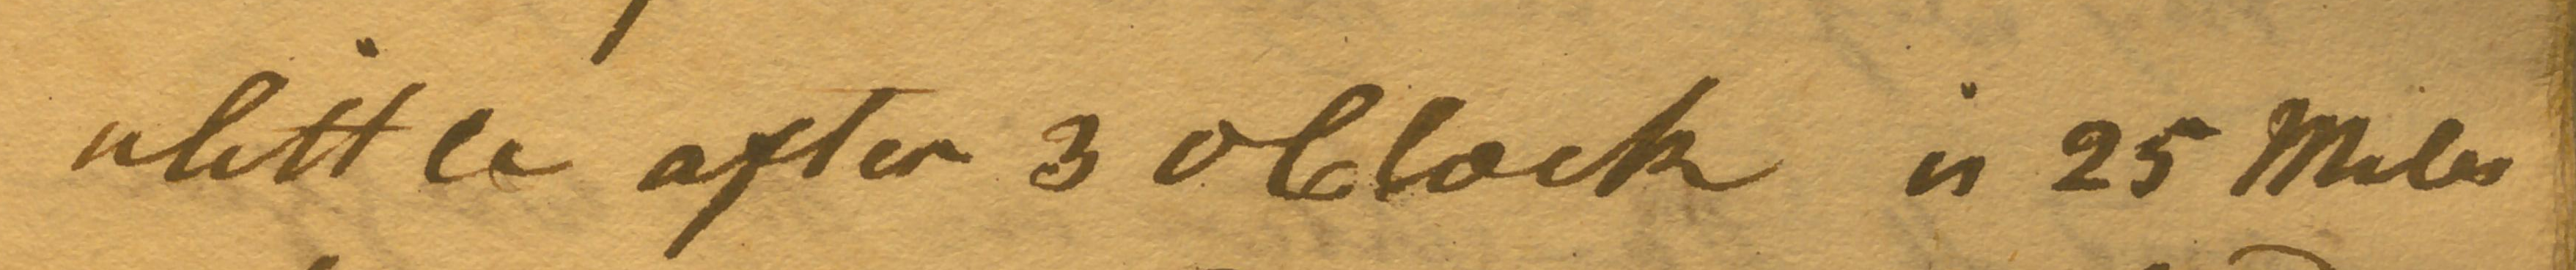a little after 3 oClock is 25 Miles
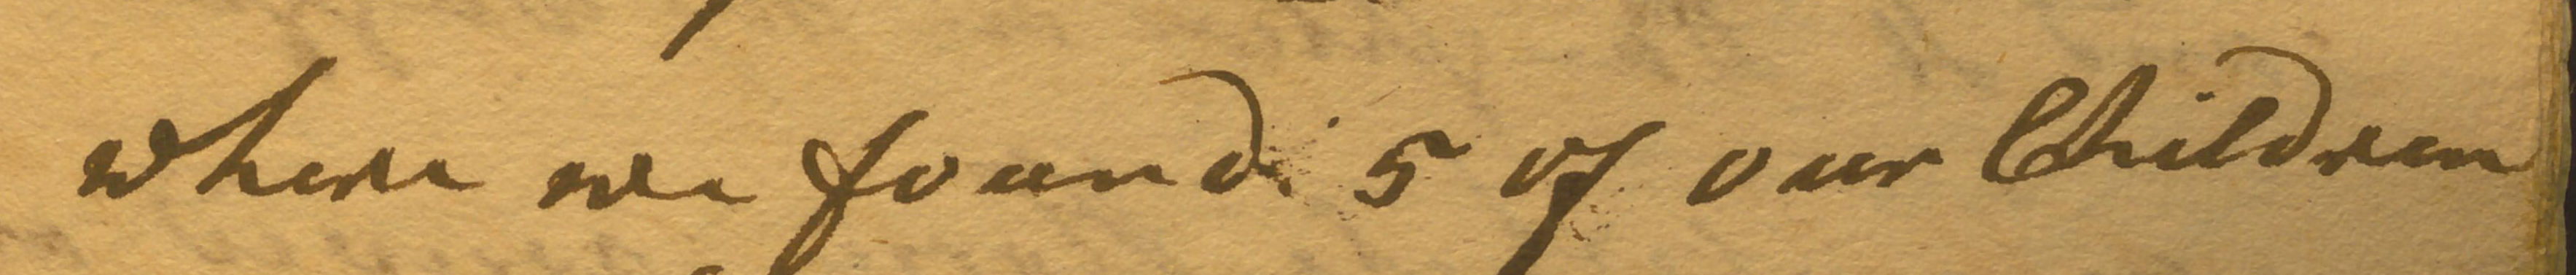where we found 5 of ouir Children
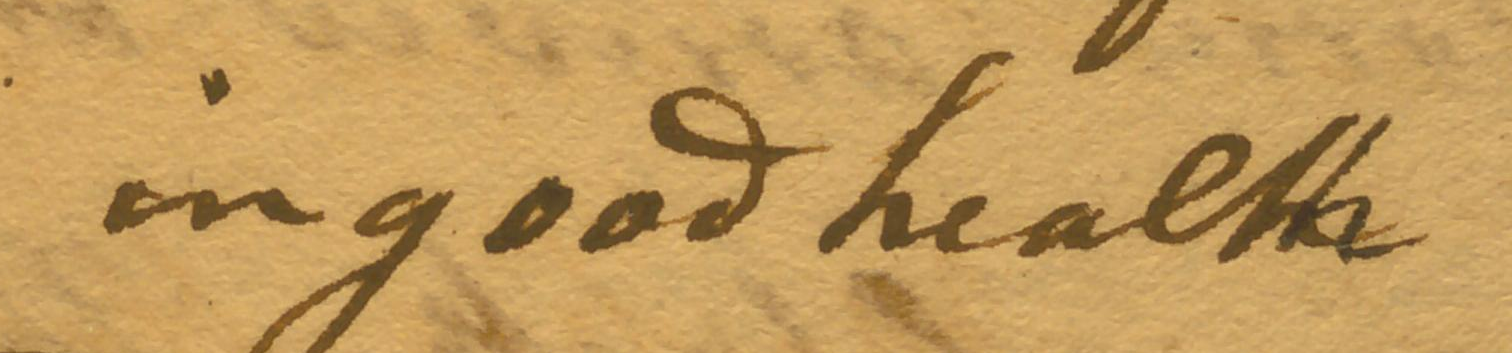in good health
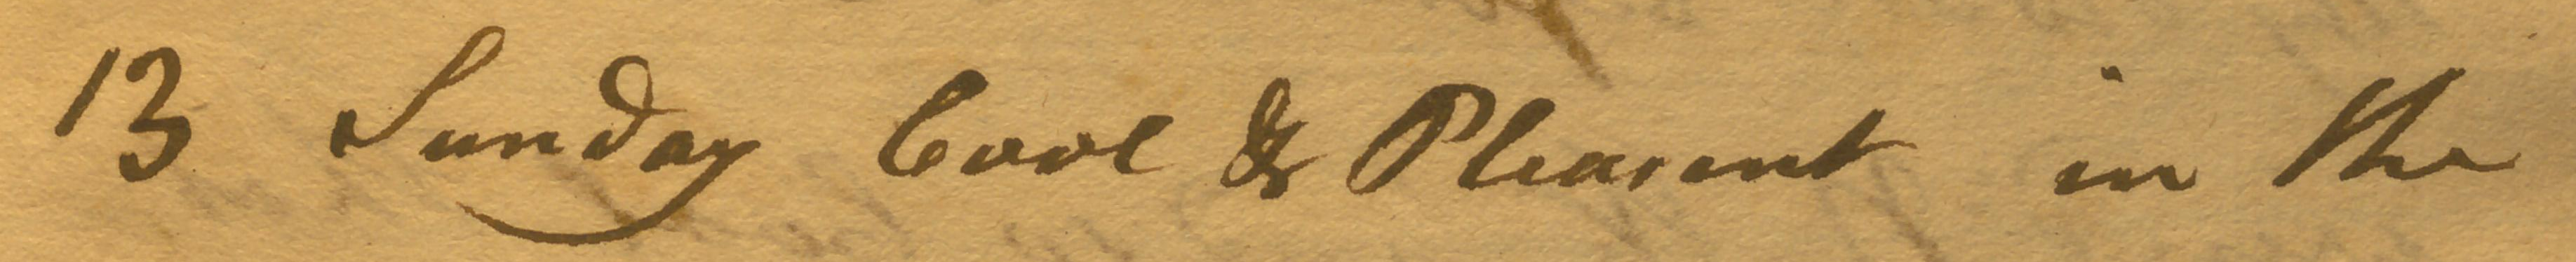13 Sunday Cool & Pleasent in the
